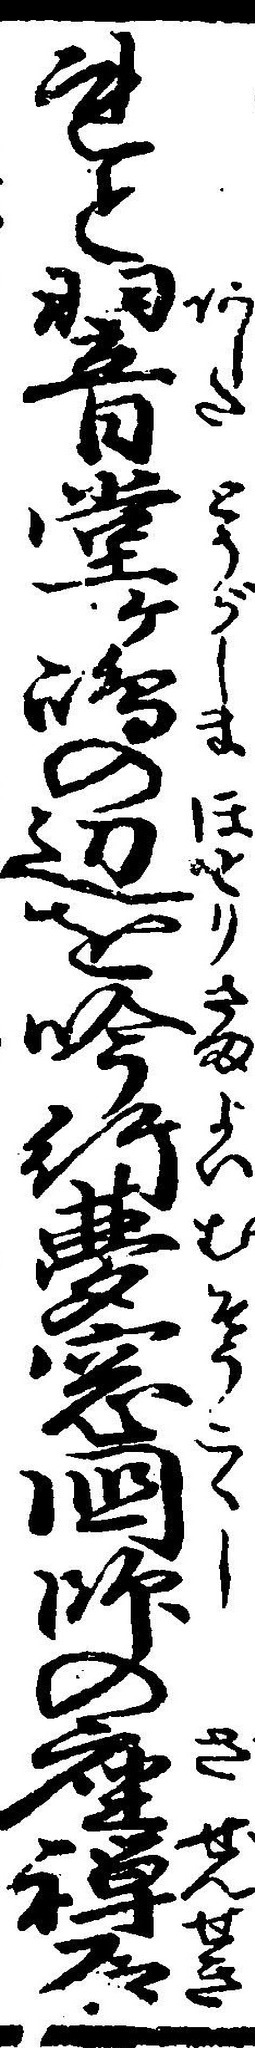れと翌日堂ヶ島の辺を吟行夢窓国師の座禅石
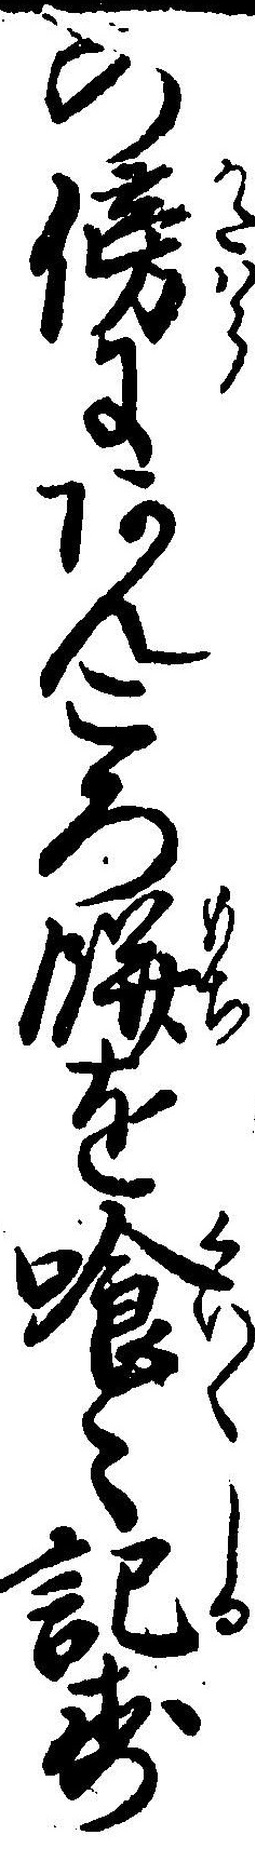の傍にあんころ餅を食々記す
